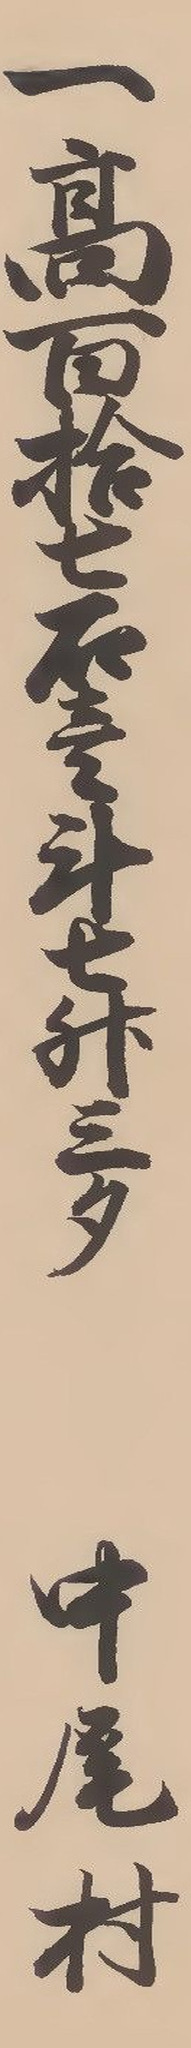一高百拾七石壱斗七升三勺中尾村
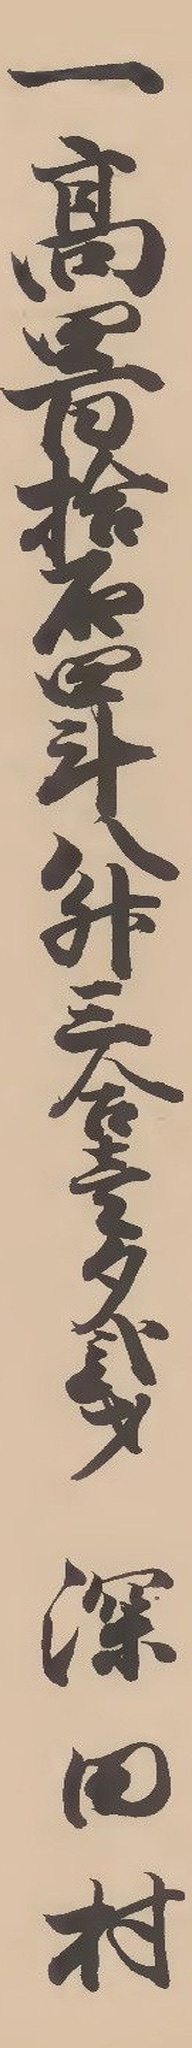一高四百拾石四斗八升三合壱勺弐才深田村
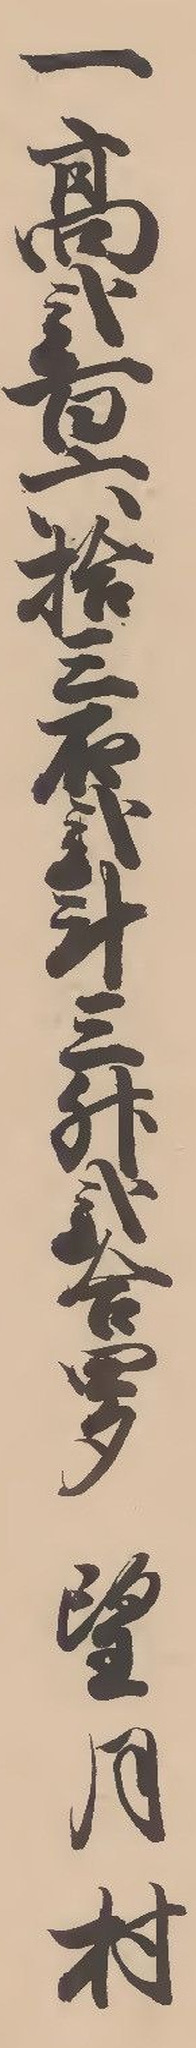一高弐百六拾三石弐斗三升弐合四勺望月村

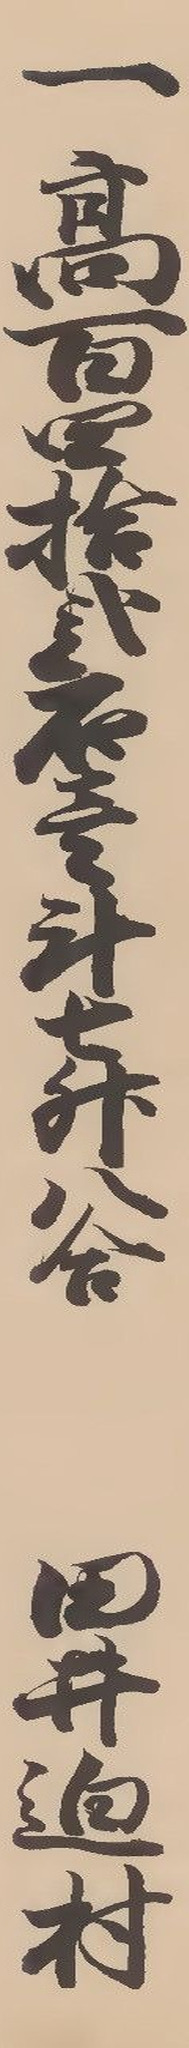一高百四拾弐石壱斗七升八合田井迫村
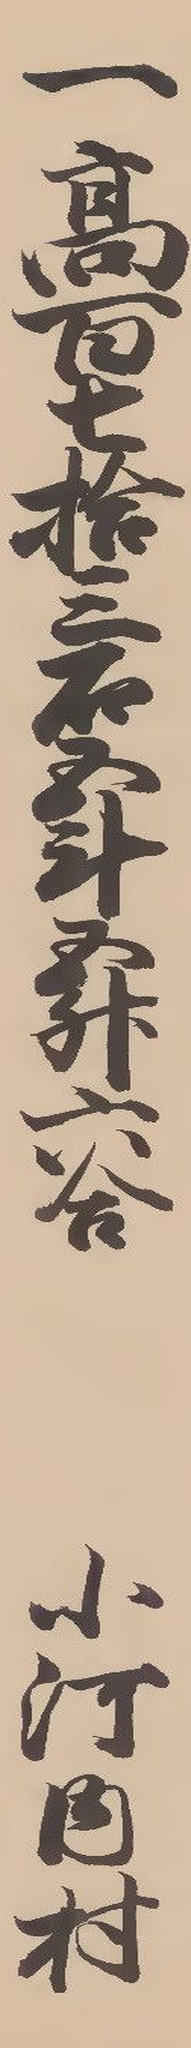一高百七拾三石五斗五升六合小河内村
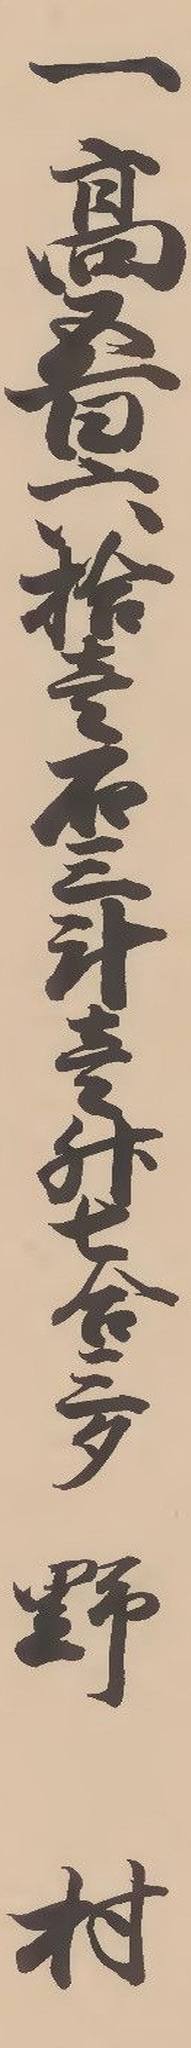一高五百六拾壱石三斗壱升七合三勺野村
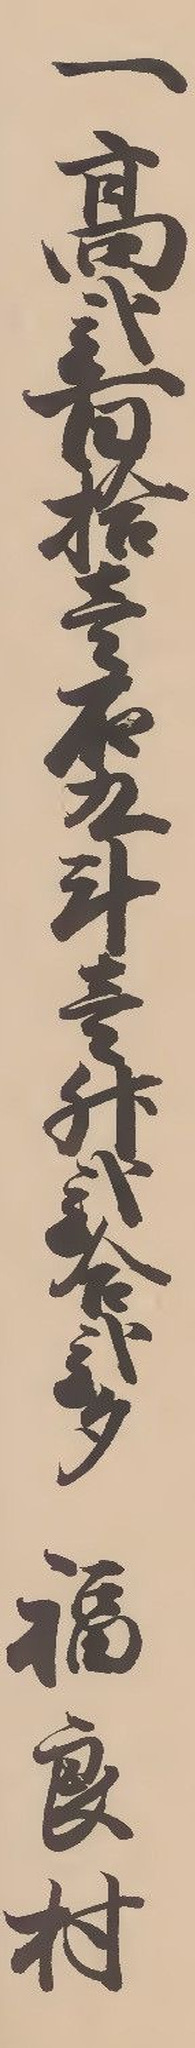一高弐百拾壱石九斗壱升弐合弐勺福良村
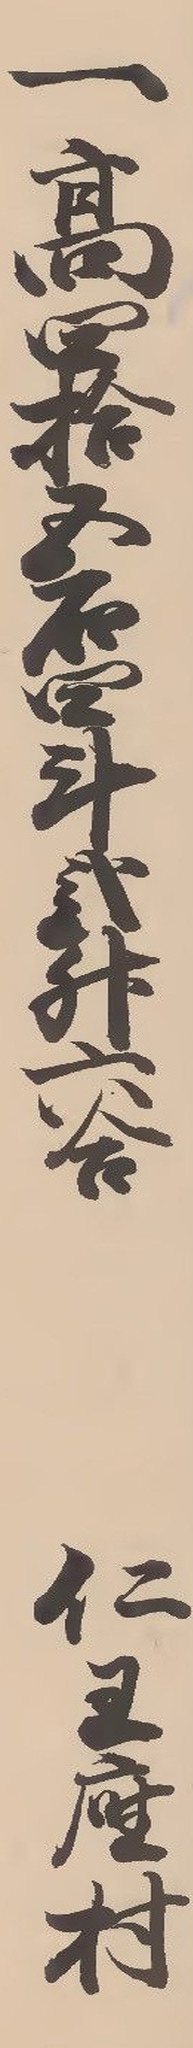一高四拾五石四斗弐升六合仁王座村
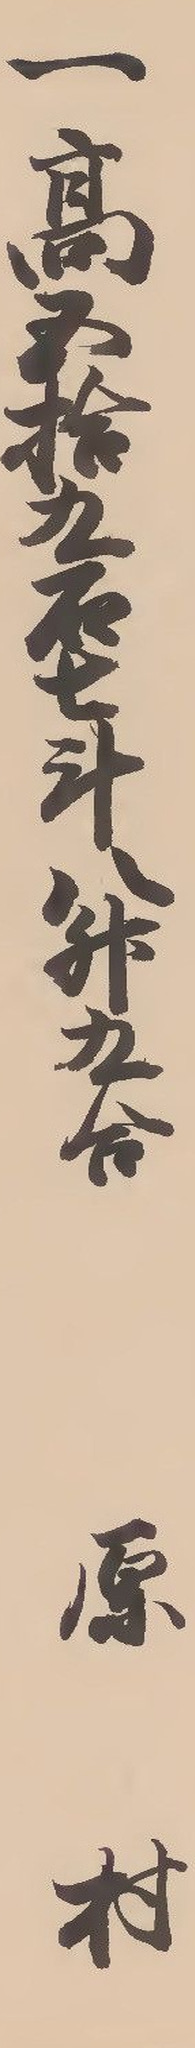一高五拾九石七斗八升九合原村
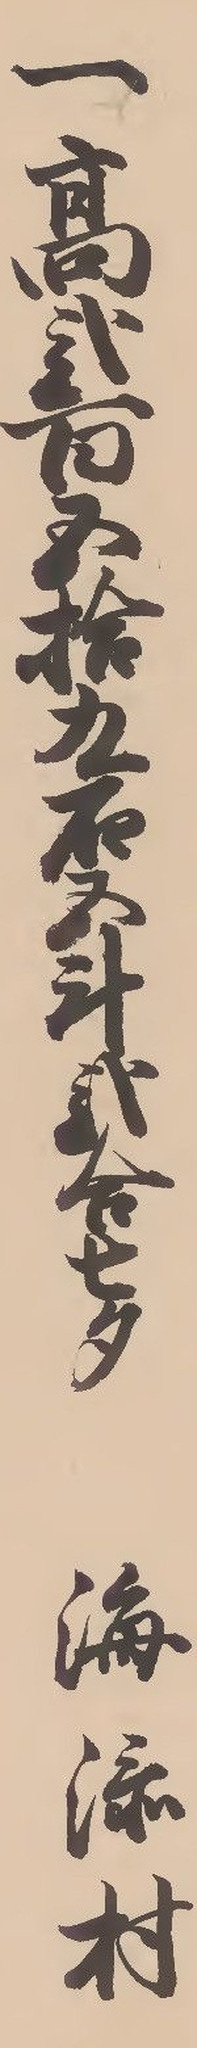一高弐百五拾九石五斗弐合七勺海添村

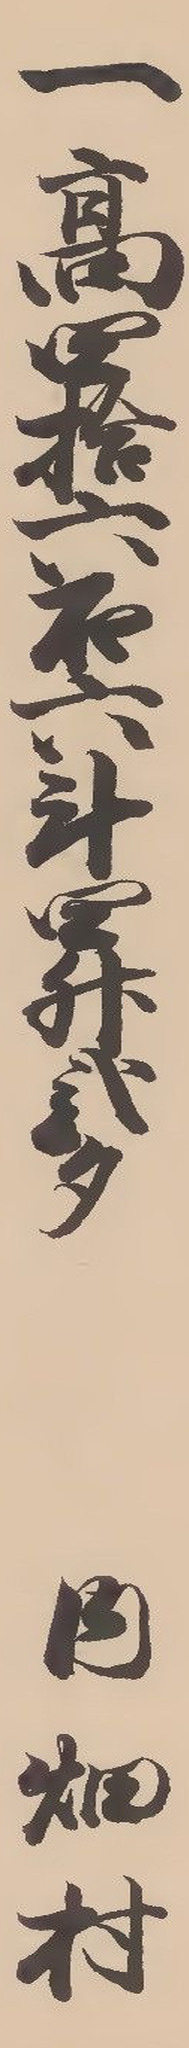一高四拾六石六斗四升弐勺内畑村
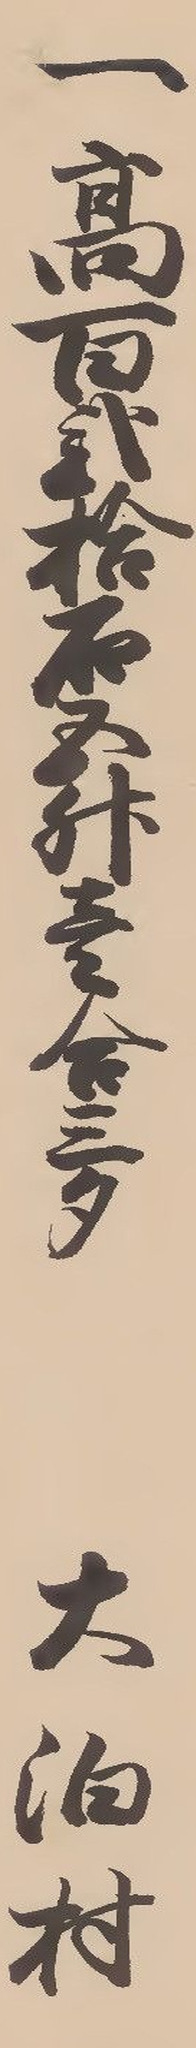一高百弐拾石五升壱合三勺大泊村
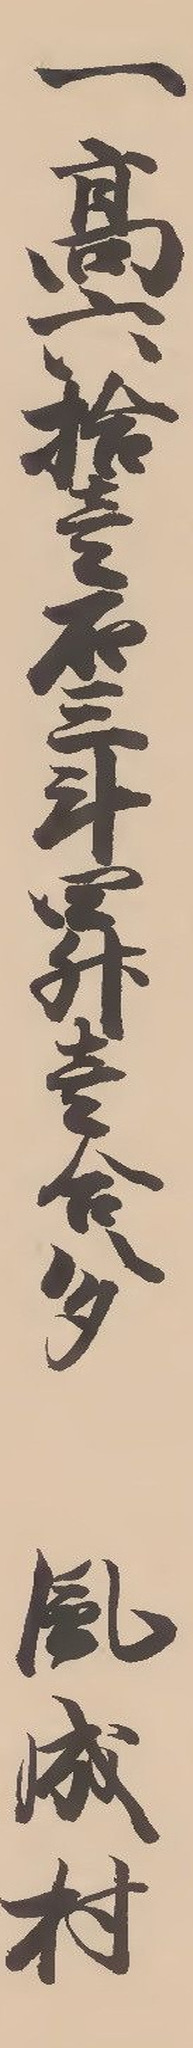一高六拾壱石三斗四升壱合八勺風成村
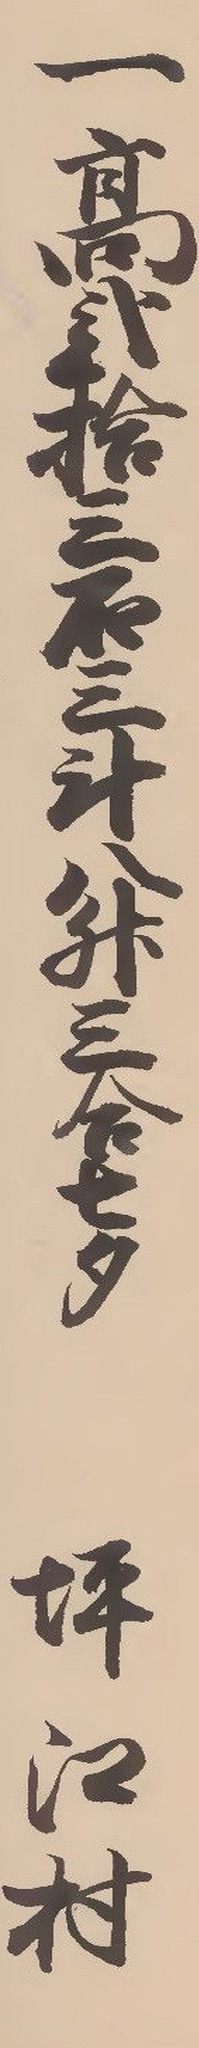一高弐拾三石三斗八升三合七勺坪江村
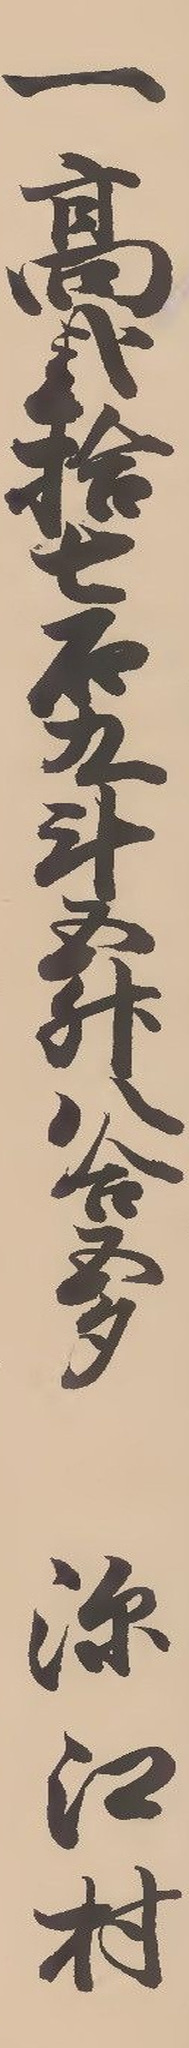一高弐拾七石九斗五升八合五勺深江村
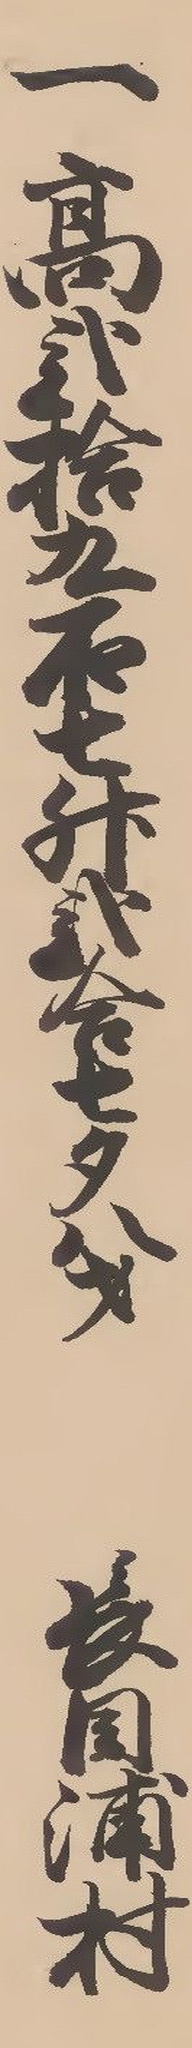一高弐拾九石七升弐合七勺八才長目浦村
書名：豊後国郷帳
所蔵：国立公文書館 National Archives of Japan
